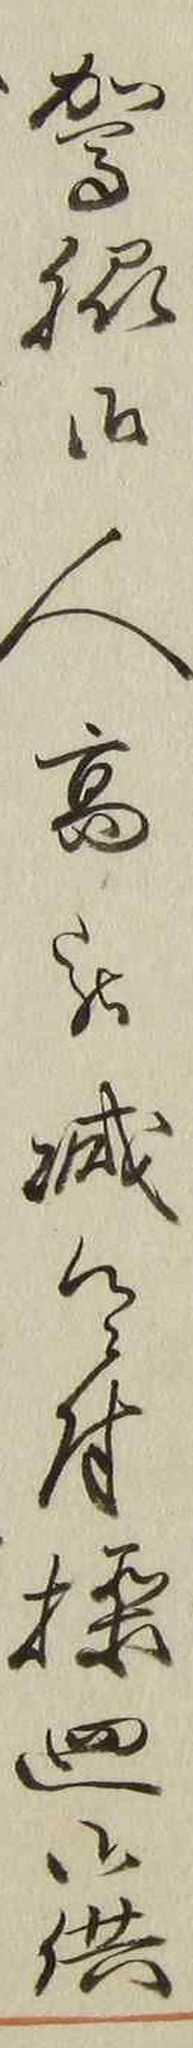駕脇御人高被減候二付繰廻御供
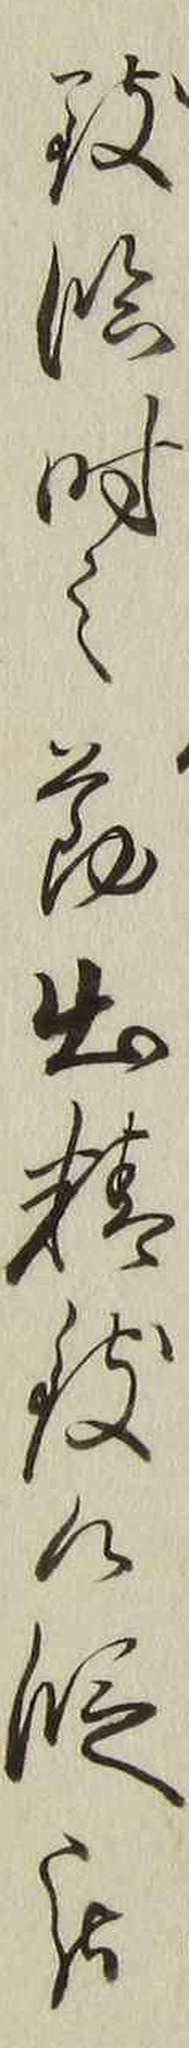致臨時之勤出精致候段被
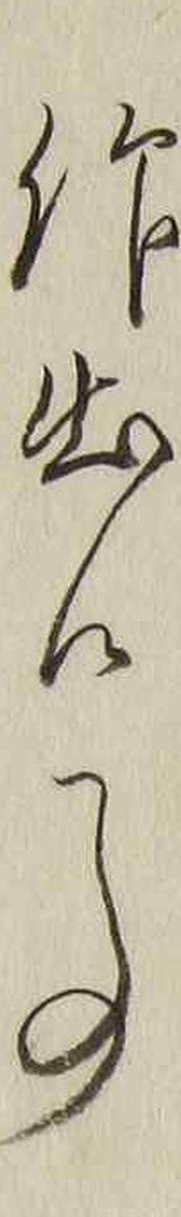仰付候事
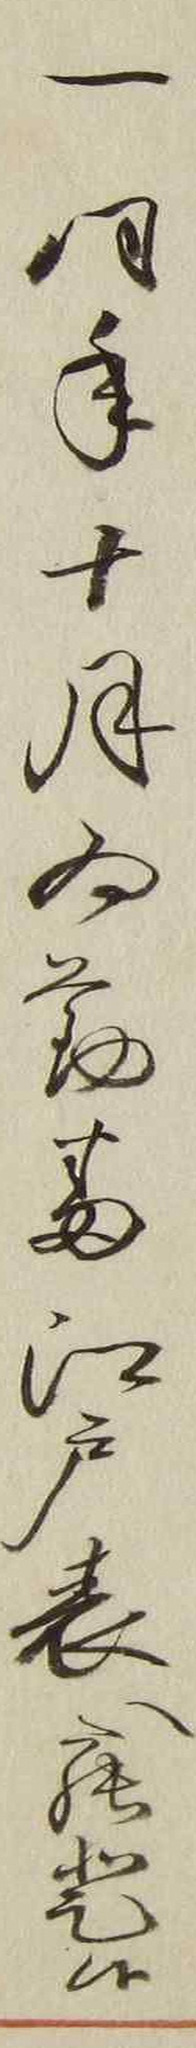一同年十月為勤番江戸表へ罷登候

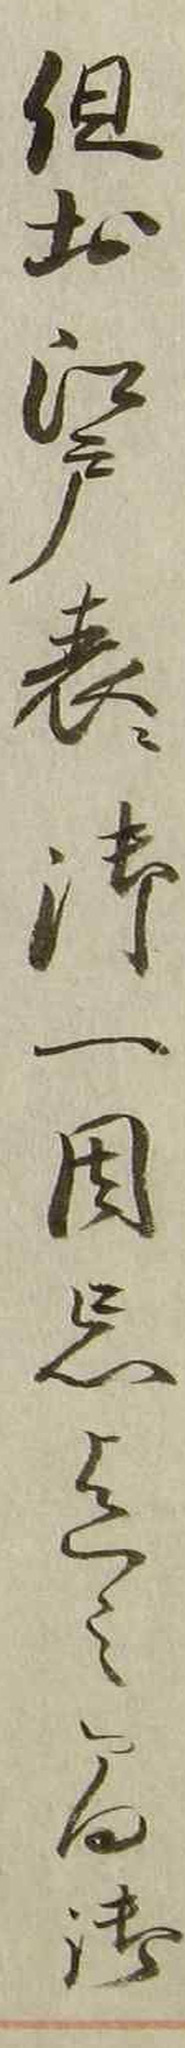但於江戸表ニ御一周忌迄之為御
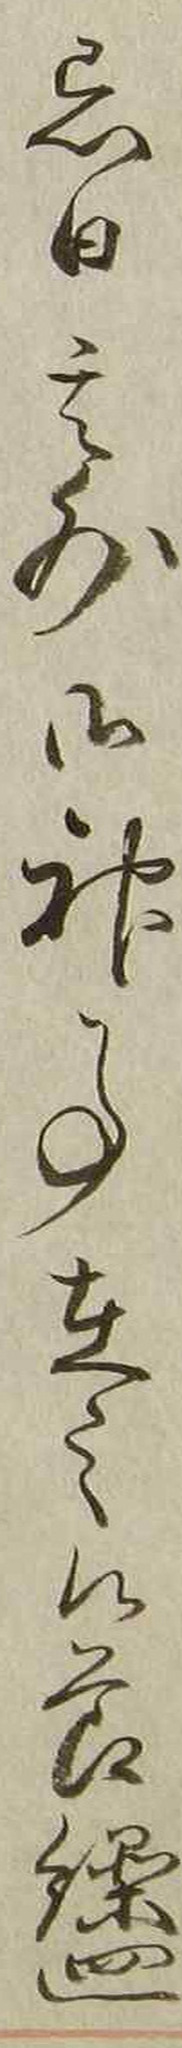忌日其外御神事在之候節繰廻
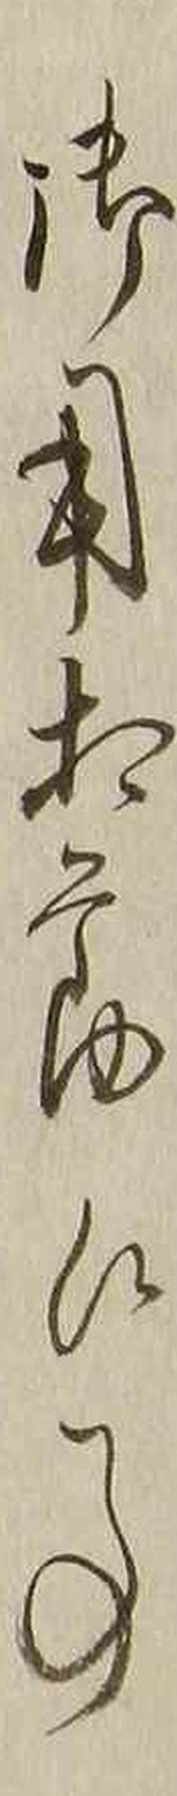御用相勤候事
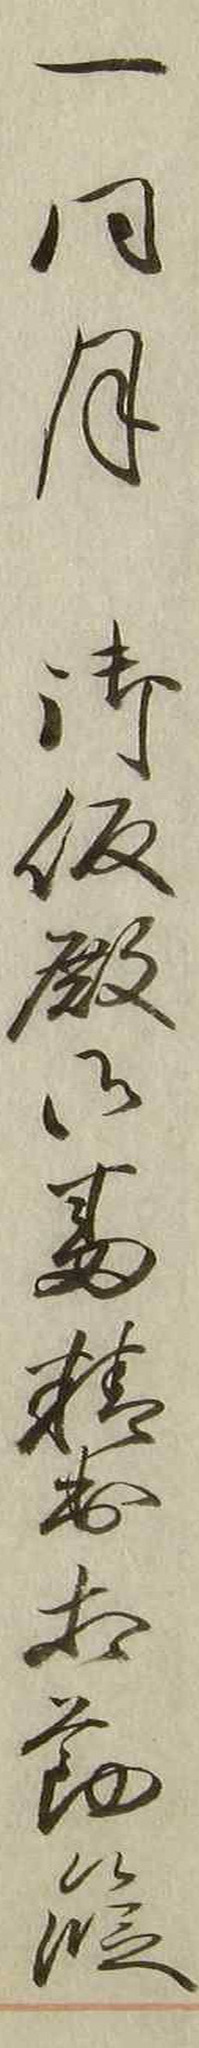一同月御仮殿御番精出相勤候段
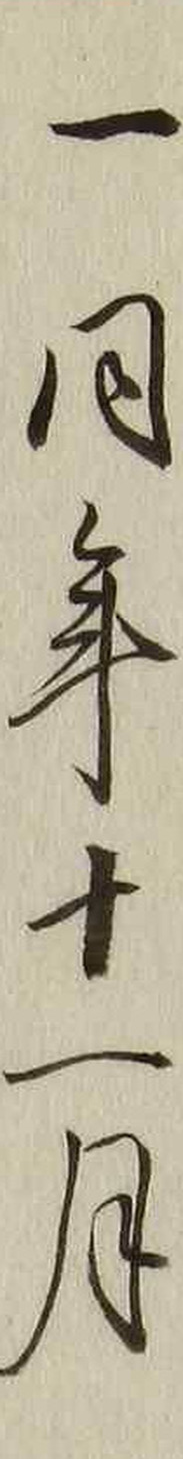一同年十一月
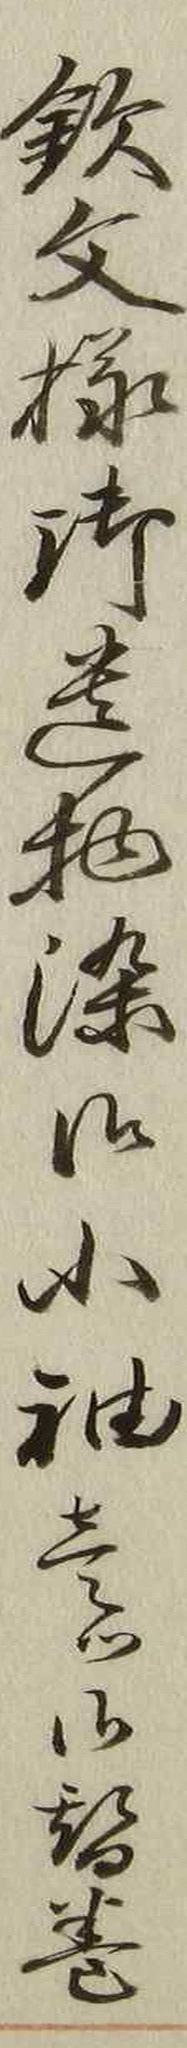欽文様御遺物染御小袖壱ツ御替巻
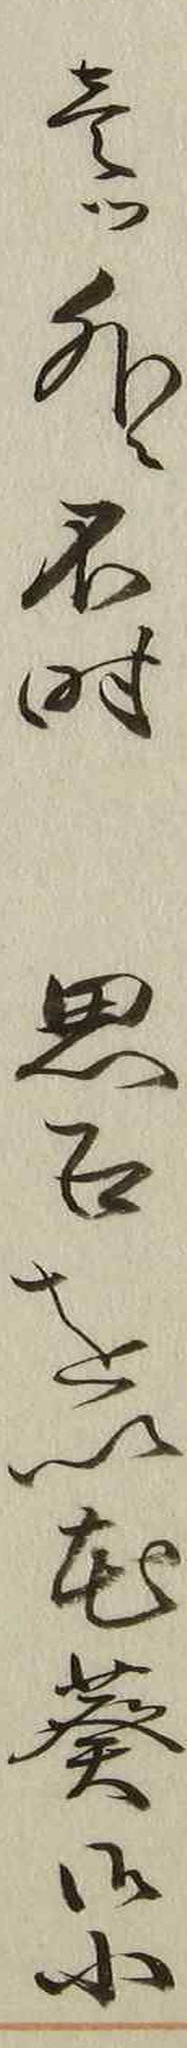壱ツ外不時思召を以花葵御小
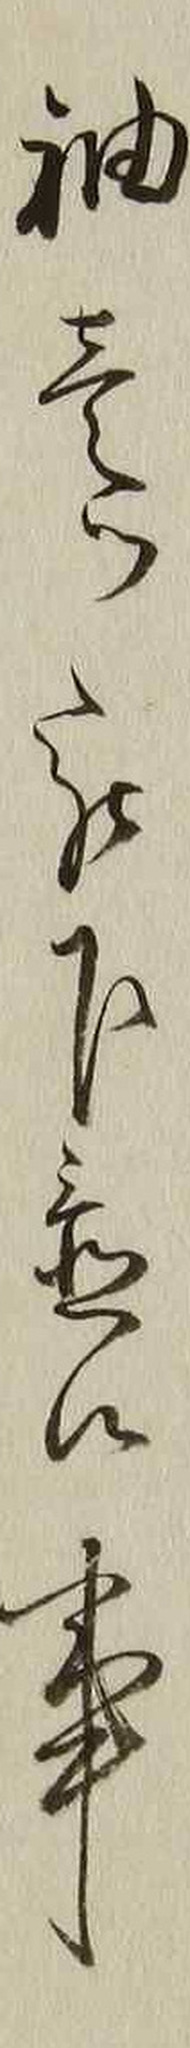袖壱ツ被下置候事
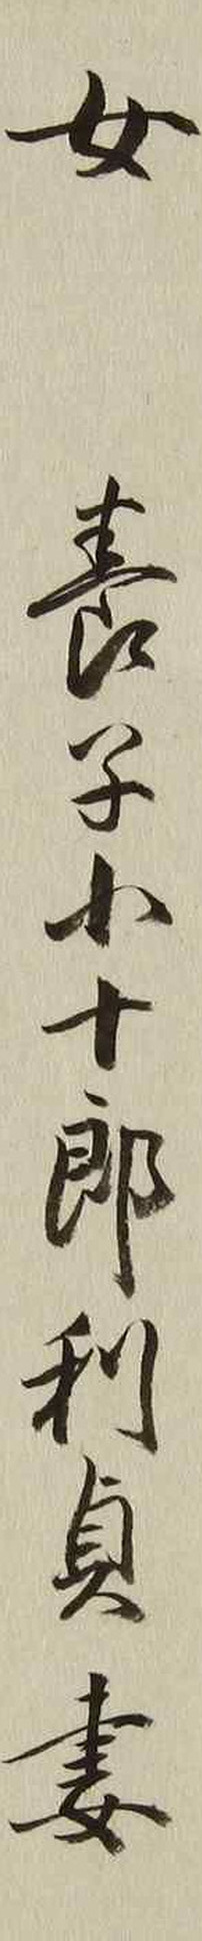女養子小十郎利貞妻
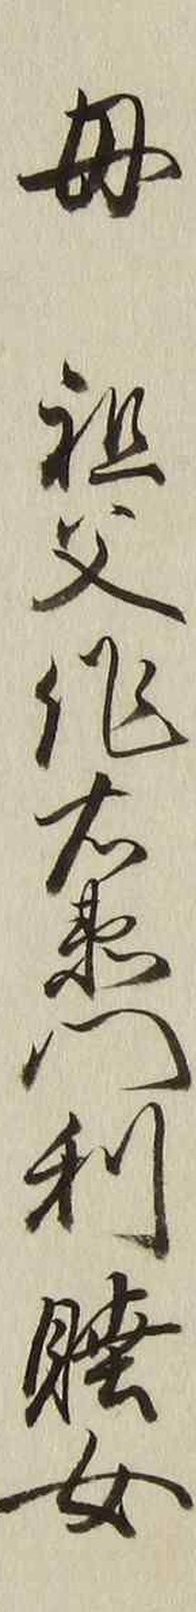母祖父作右衛門利睦女

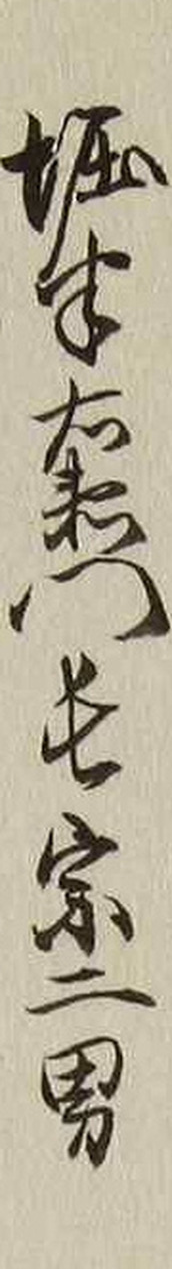堀半右衛門長宗二男
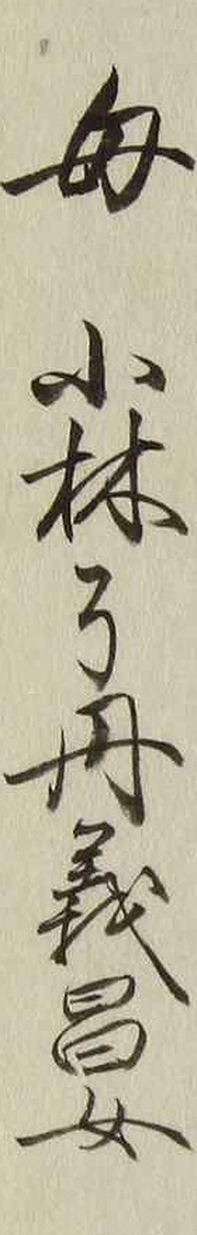母小林了丹義昌女
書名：諸士系譜　巻之54　ほ之部1
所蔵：会津若松市立会津図書館
